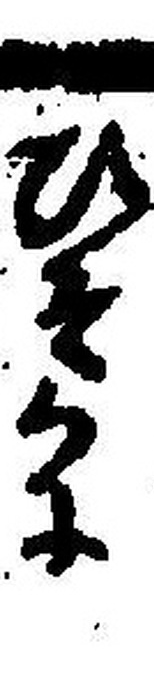ひそかに
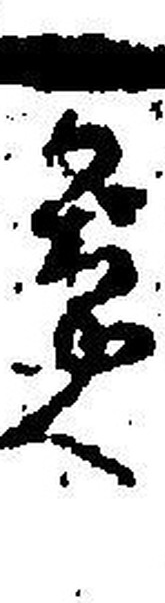かぢやへ
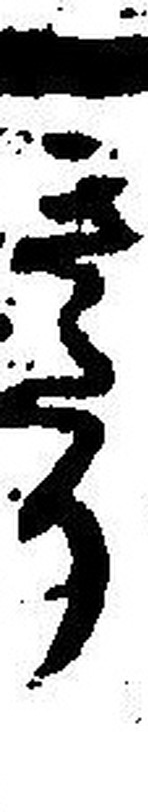きたり
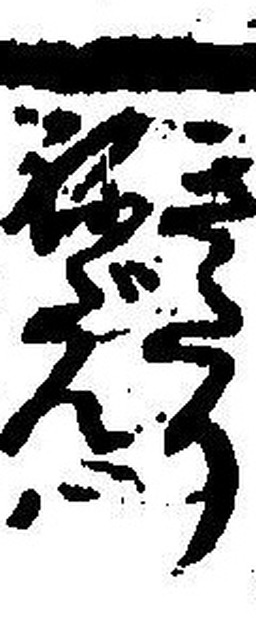ねだんは
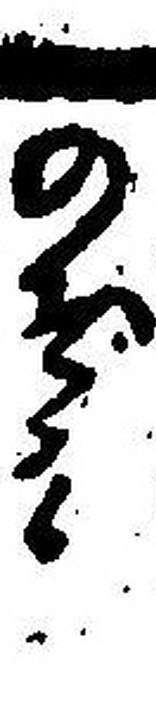のぞみ
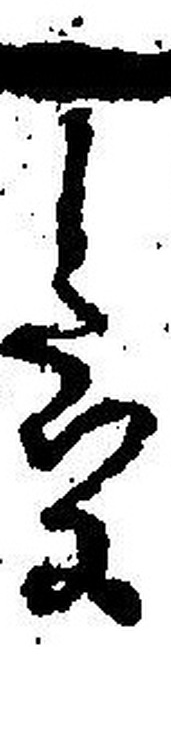したいに
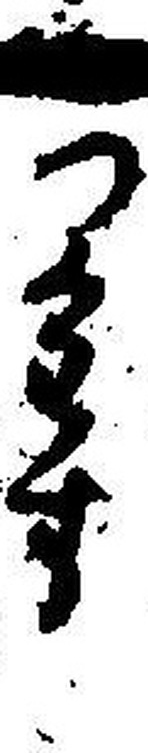つかわす
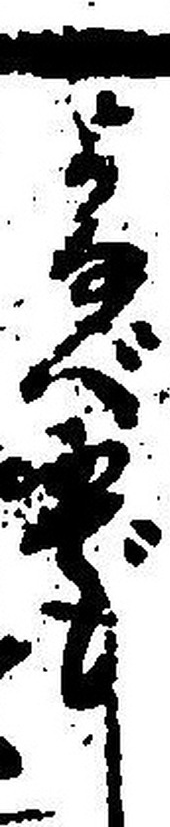よなべにでも
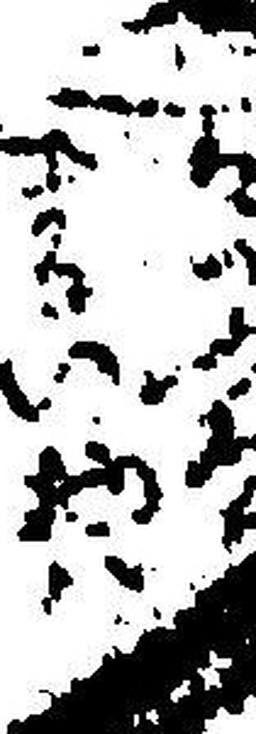まるい物は
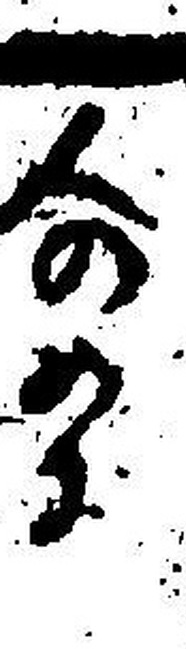人のめに
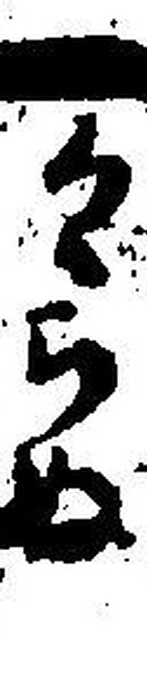かゝらぬ
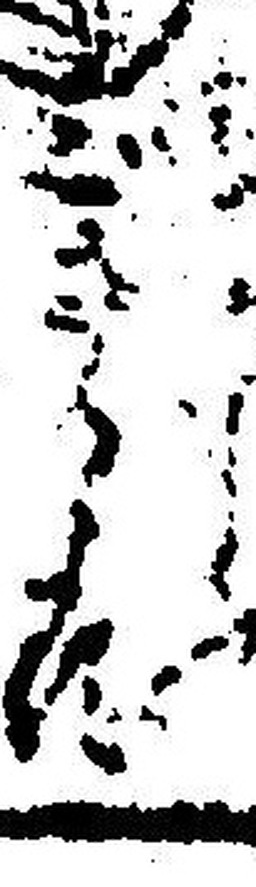ごさります
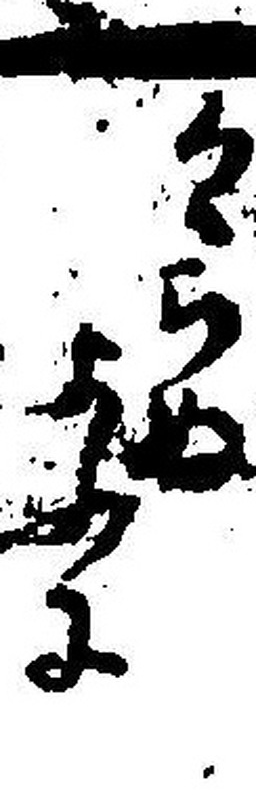よふに
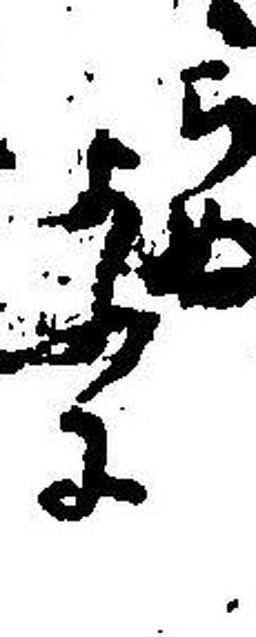よふに
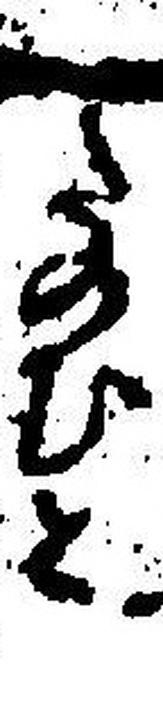たのむと
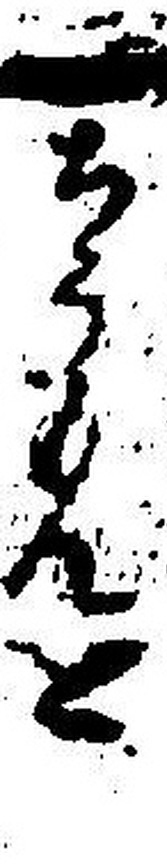ちうもんを
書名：御代参牛時詣 / 市場通笑作
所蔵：東京大学総合図書館 General Library in the University of Tokyo, JAPAN
